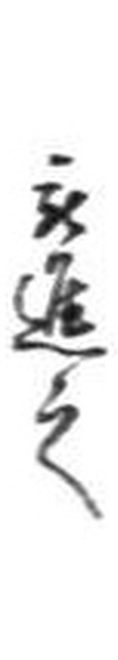被進之
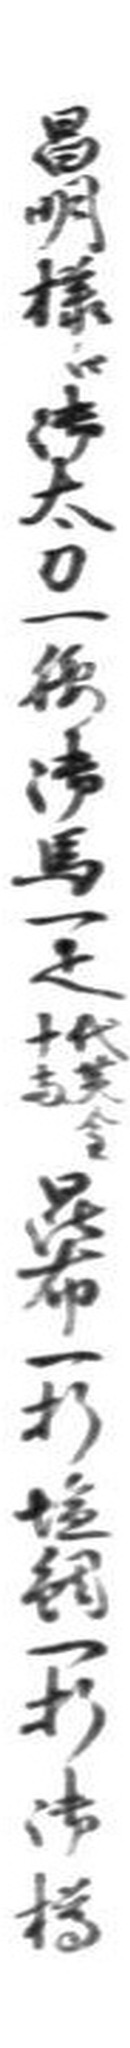昌明様江御太刀一腰御馬一疋代黄金十両昆布一折塩鯛一折御樽
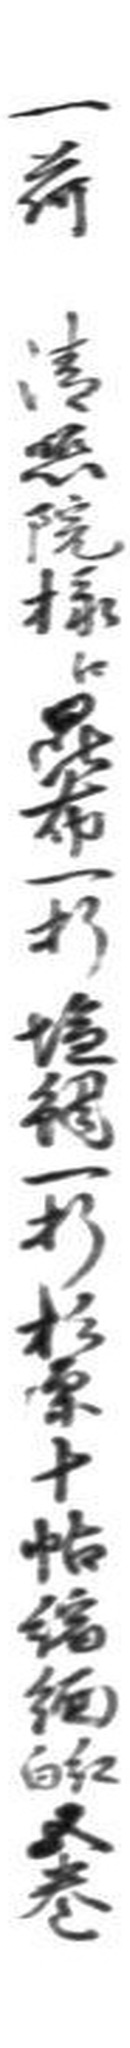一荷清照院様江昆布一折塩鯛一折杉原十帖縮緬紅白五巻
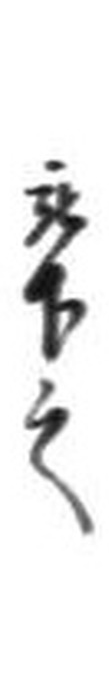被下之

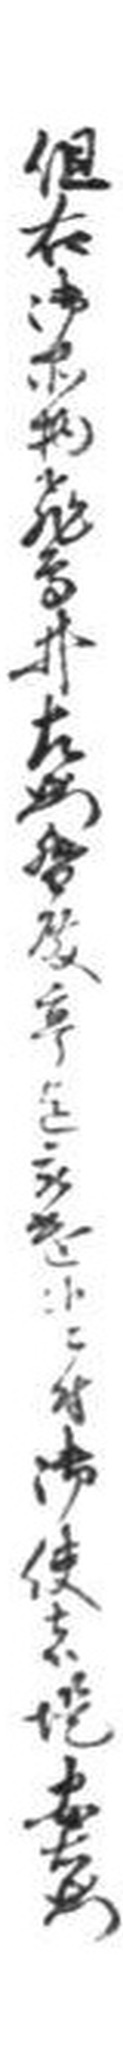但右御品物飛鳥井左衛門督殿亭迄被遣候ニ付御使者堤安右衛門
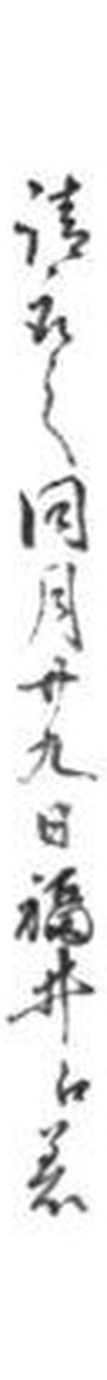請取之同月廿九日福井江着
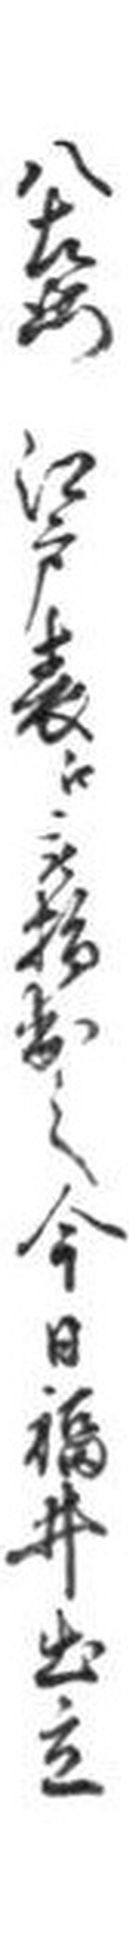八左衛門江戸表江被指出之今日福井出立
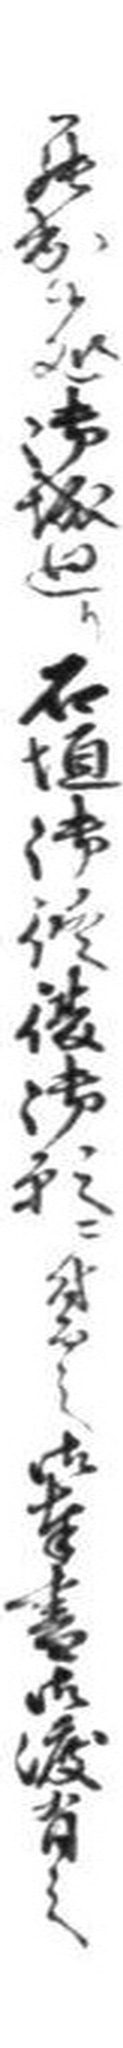罷出候処御城廻り石垣御修復御願ニ付而之御奉書御渡有之
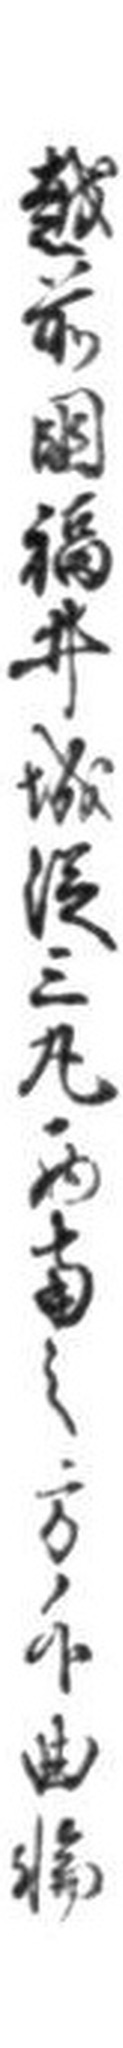越前国福井城従三丸西南之方外曲輪
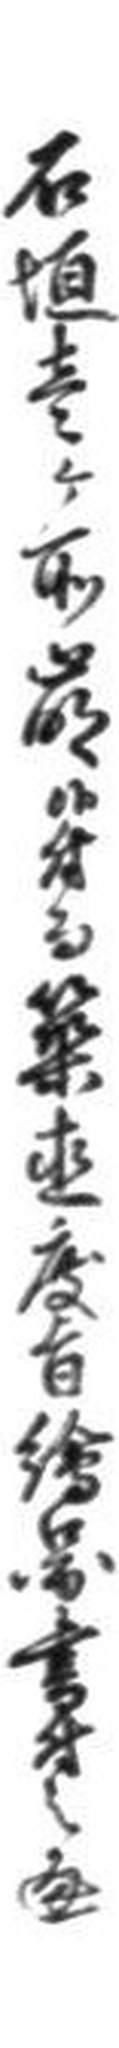石垣壱ケ所崩候付而築直度旨絵図書付之通
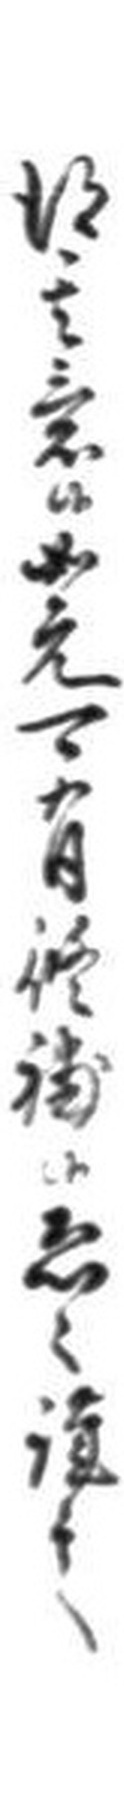得其意候如元可有修補候恐々謹言
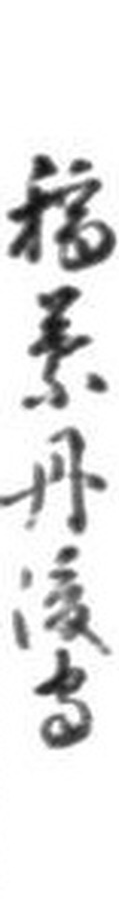稲葉丹後守
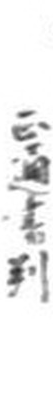正武書判
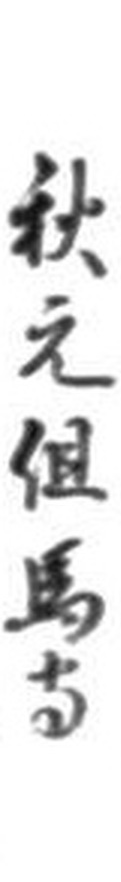秋元但馬守
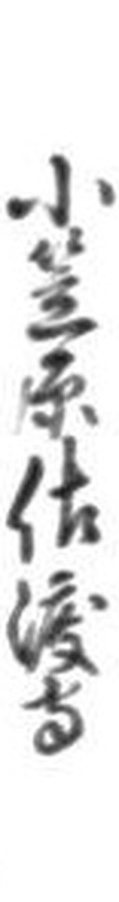小笠原佐渡守
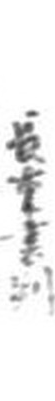長重書判
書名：家譜 二十一 吉品公 従元禄十三年到同十四年
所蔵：福井県文書館 Fukui Prefectural Archives
